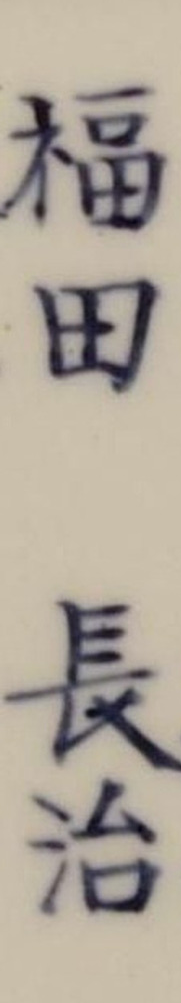福田長治
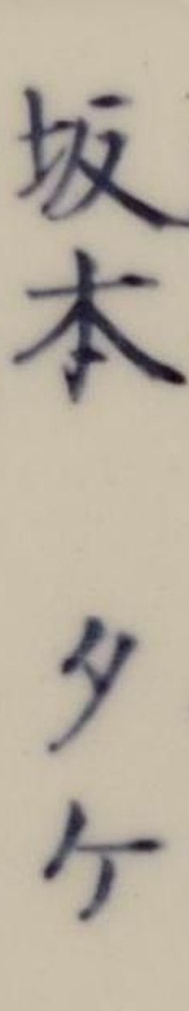坂本タケ
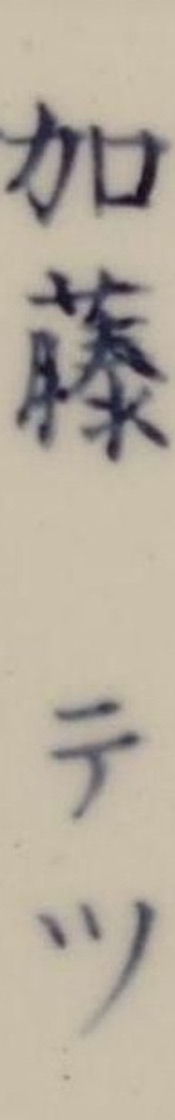加藤テツ
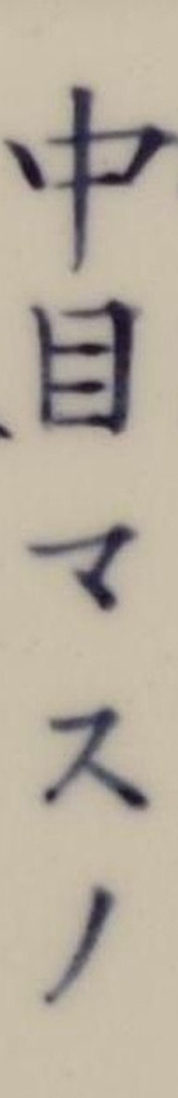中目マスノ
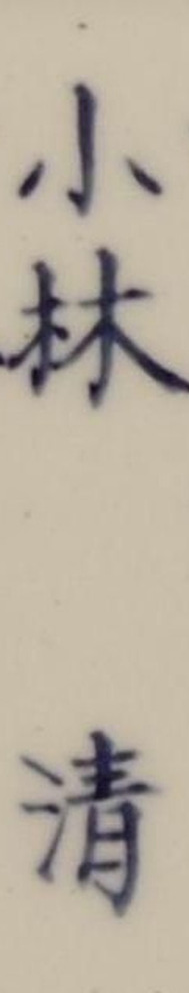小林清
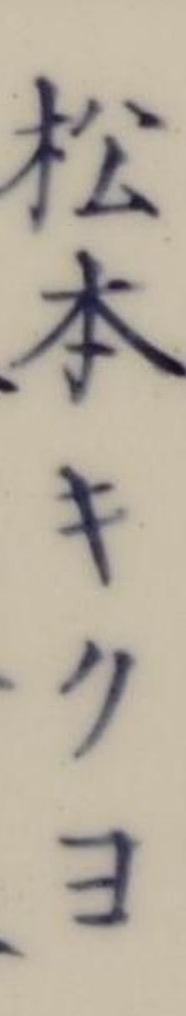松本キクヨ
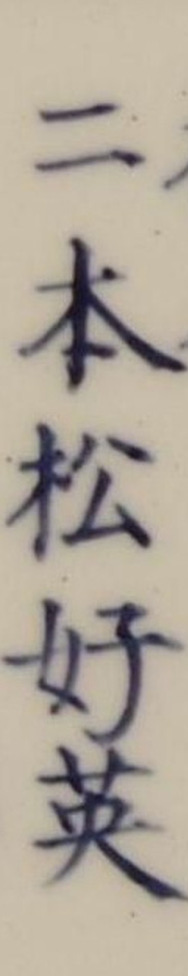二本松好英
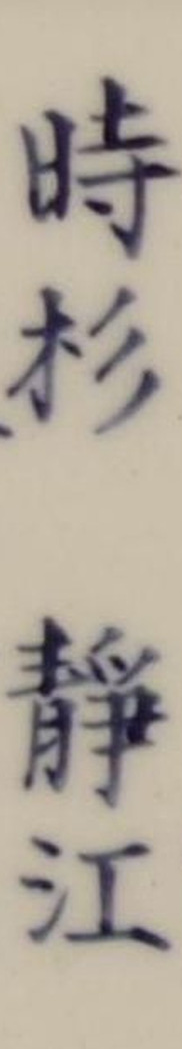時杉静江
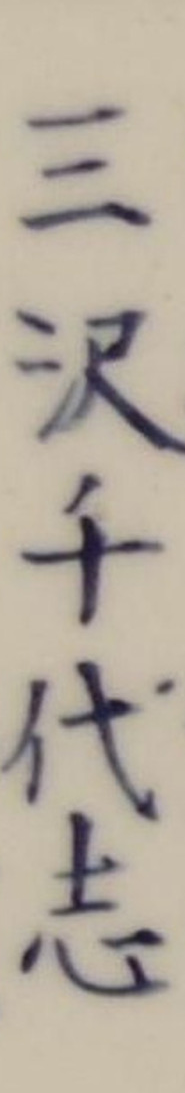三沢千代志

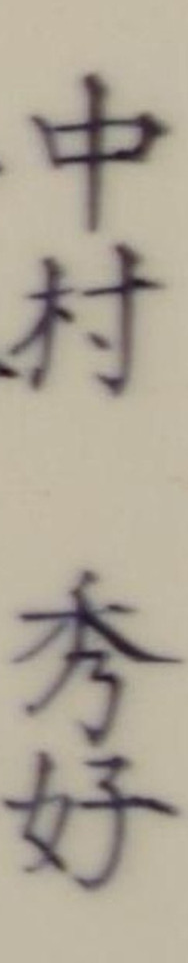中村秀好
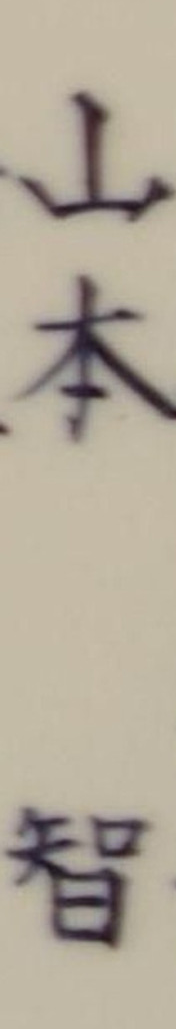山本智
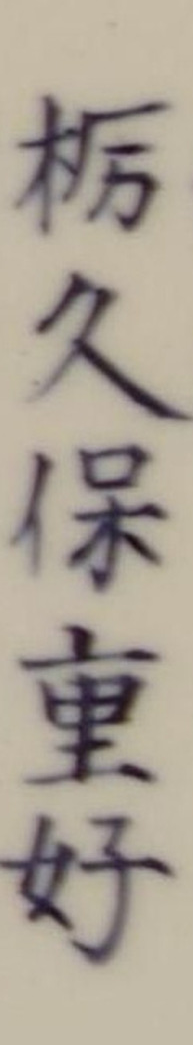栃久保重好
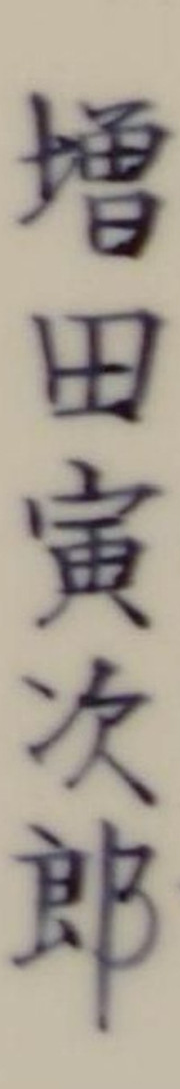増田寅次郎
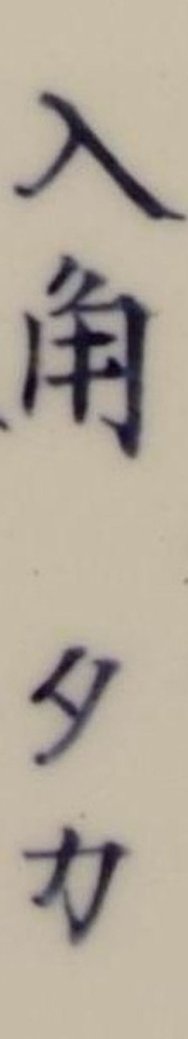入角夕カ
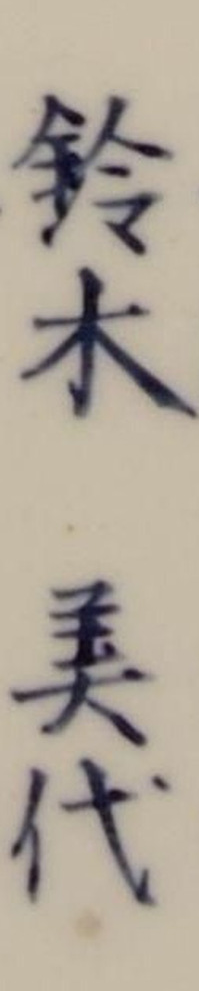鈴木美代
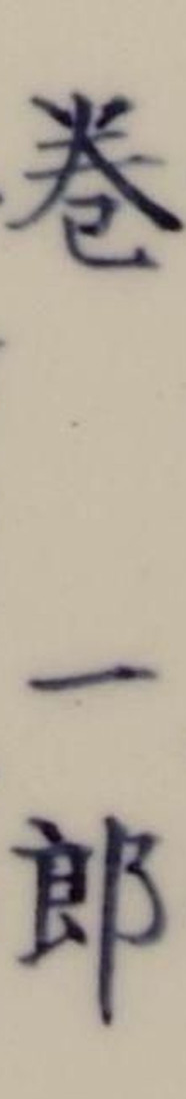巻一郎
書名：M~S
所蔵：高野山金剛峯寺
